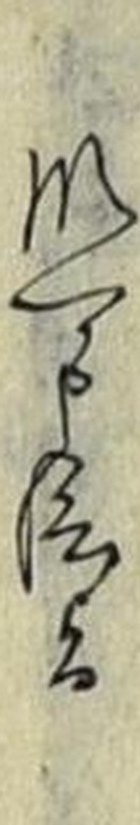段可申渡旨
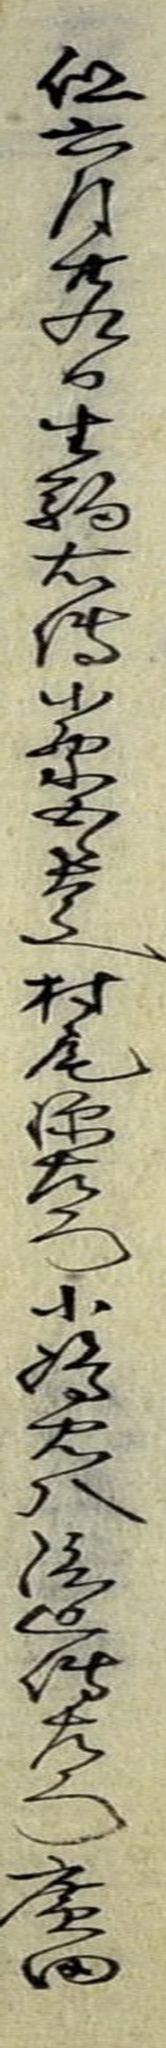但六月廿九日生駒右伝小栗五郎大夫村尾源左衛門小嶋忠八渡辺伝左衛門広田
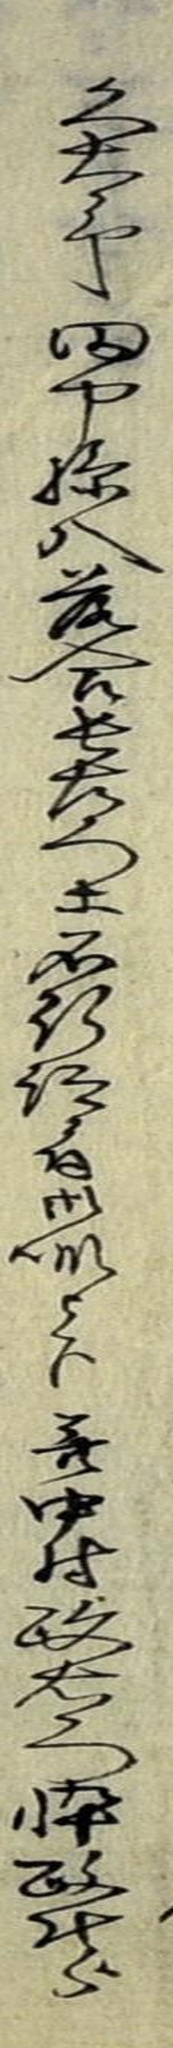久太郎田中孫八落合長左衛門等不行跡ニ付御暇被下并中村政右衛門忰政次郎
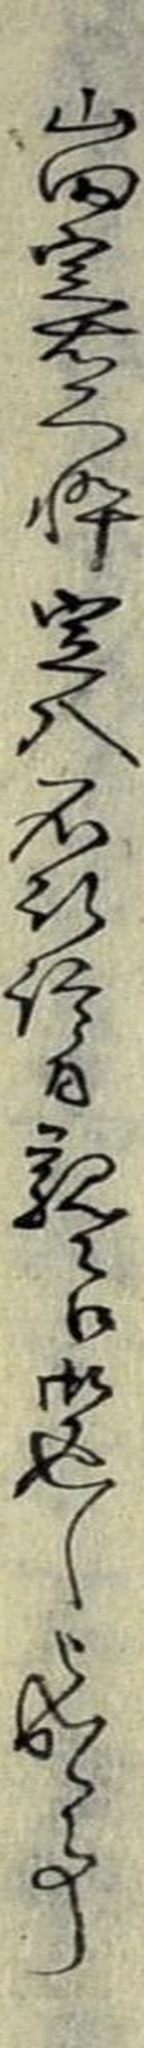山田定右衛門忰定八不行跡ニ付親々江御返し被成候事
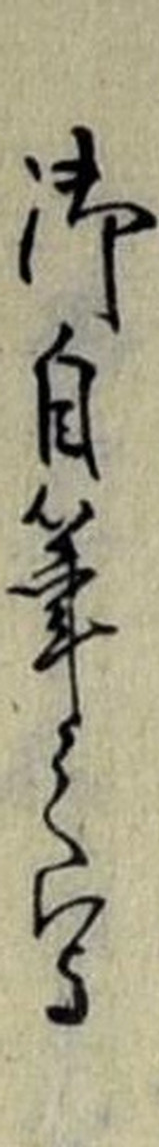御自筆之写
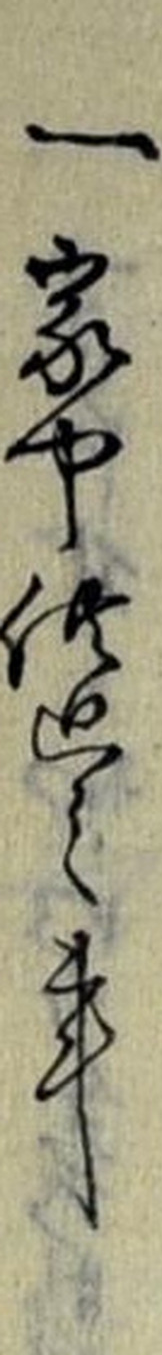一家中供廻之事
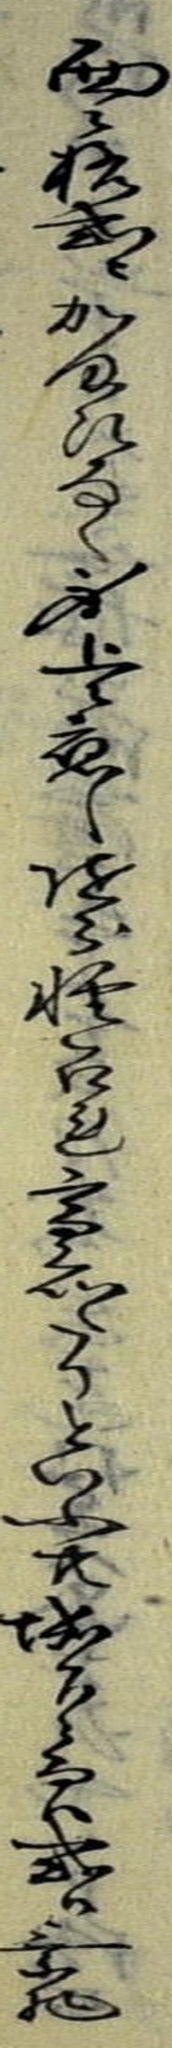面々格式ニかまひなく身上ニ応し随分軽召連高知たりといふ共城下ニ而ハ或ハ乗物
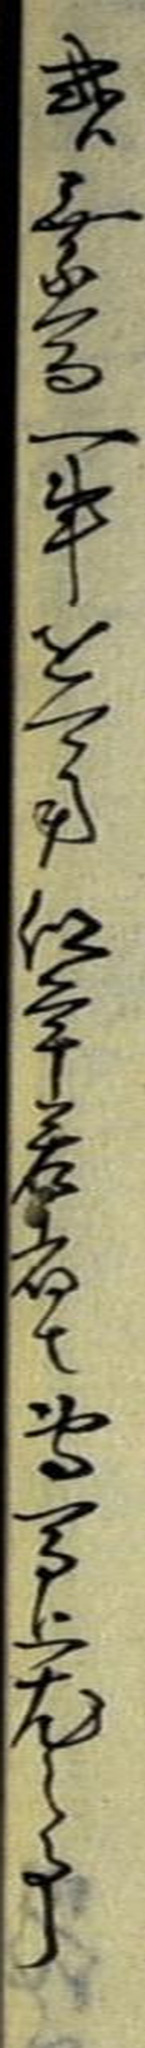或ハ乗馬一事を可用但年若者者専馬上尤之事
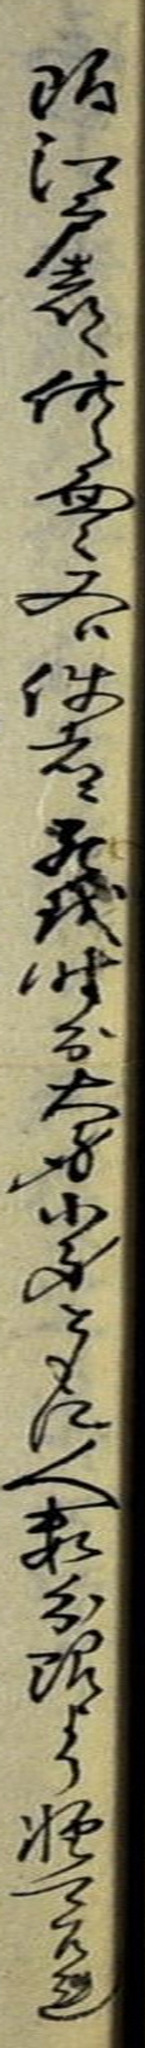附江戸表へ供之面々又ハ使者ニ罷越時分大身小身ともに人数分限より軽可召連
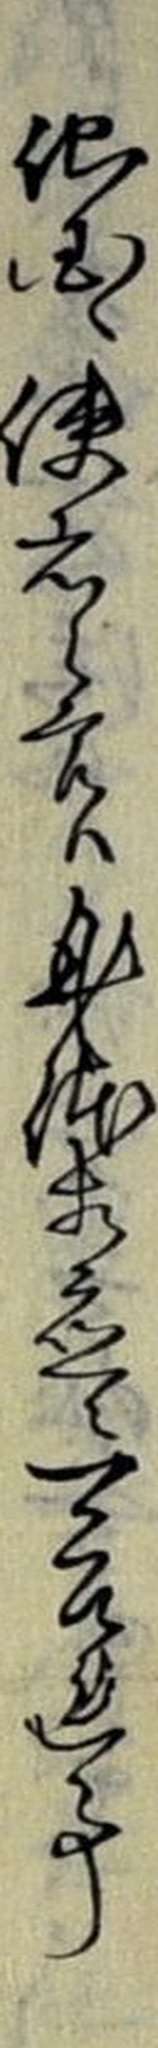他国へ使者之節ハ身体相応ニ可召連事
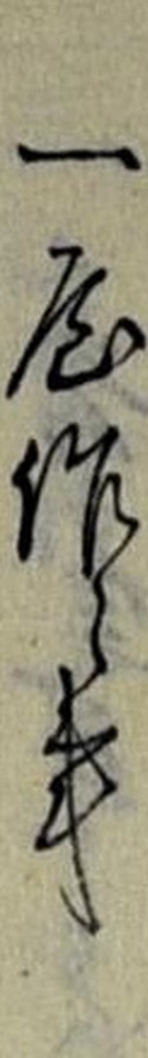一屋作之事
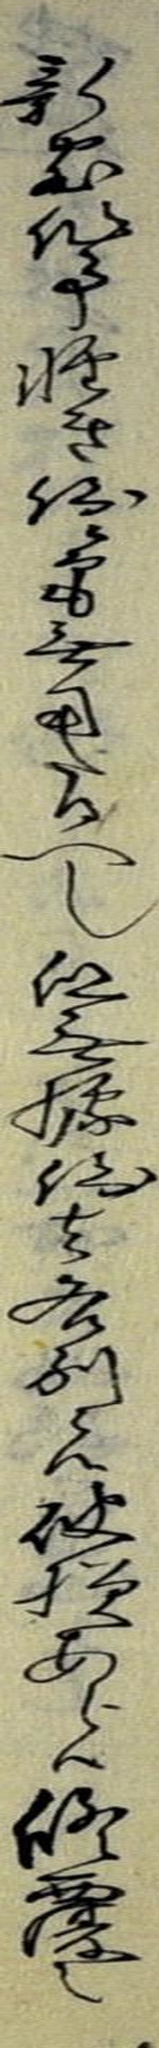新敷作事軽き儀ニ而も無用たるへし但無拠儀者各別ニ候破損あらハ修覆之
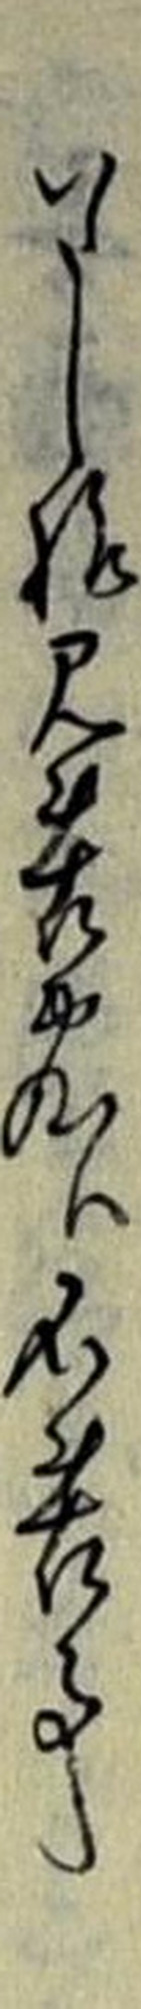いたし様見苦敷ハ不苦事
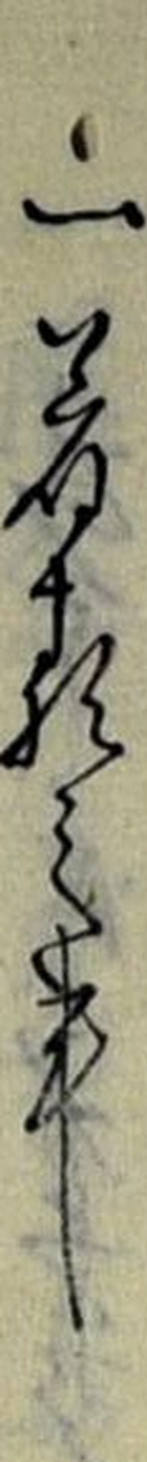一着類之事
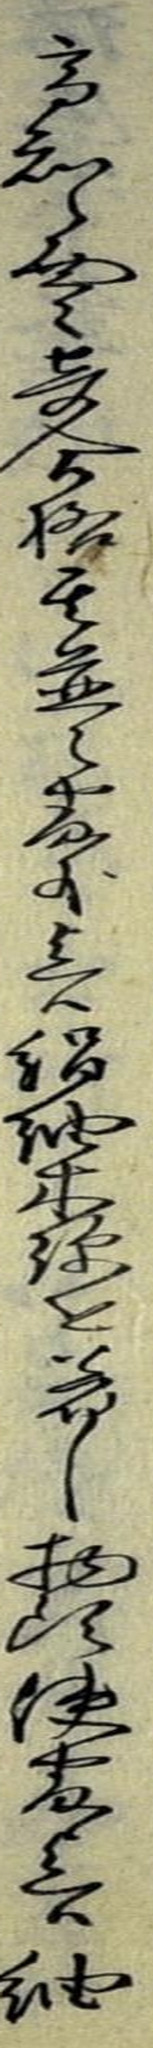高知之面々寄合格其並之番外迄ハ絹紬木綿を着し物頭使番迄ハ紬
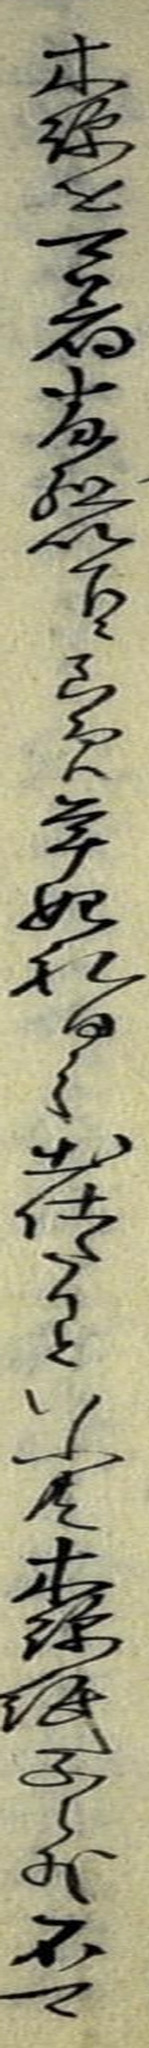木綿を可着番組以下ニ至而ハ年始礼日之出仕たりといふ共木綿紙子之外不可
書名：命令之部 一
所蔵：福井県文書館 Fukui Prefectural Archives
